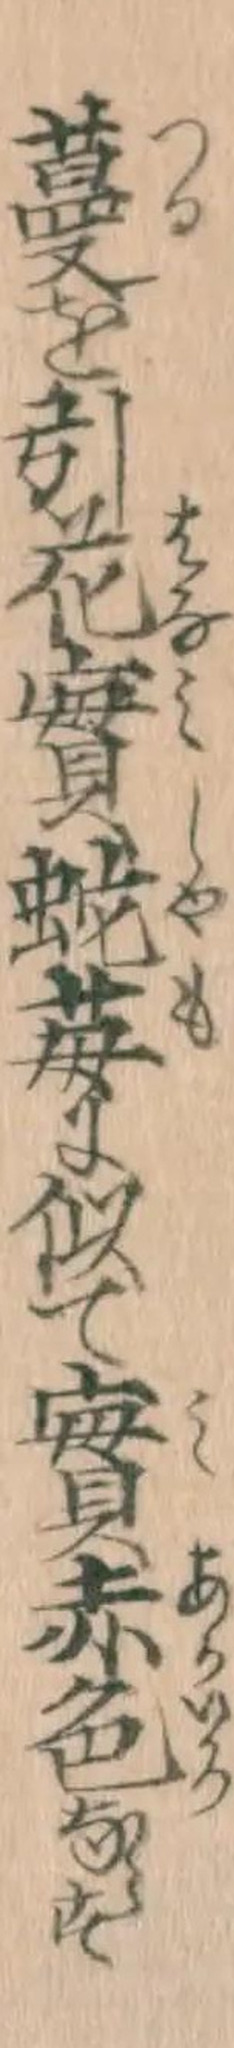蔓を引花実蛇苺に似て実赤色ならす
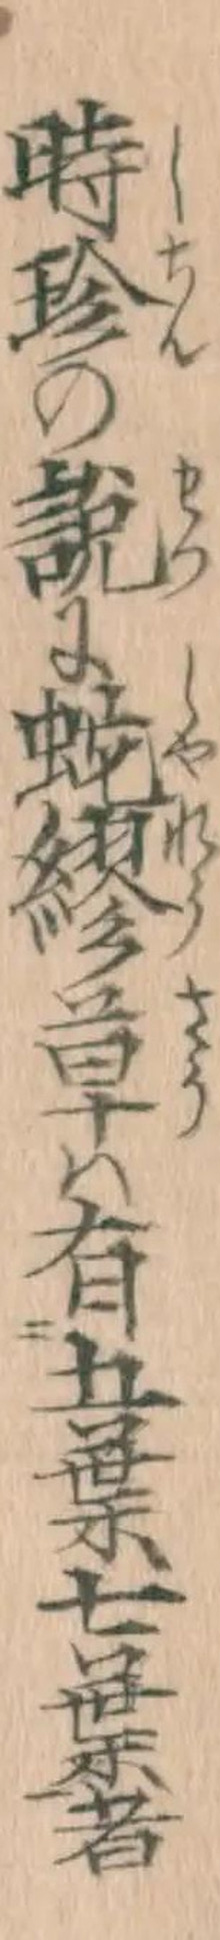時珍の説に蛇繆草は有五葉七葉者
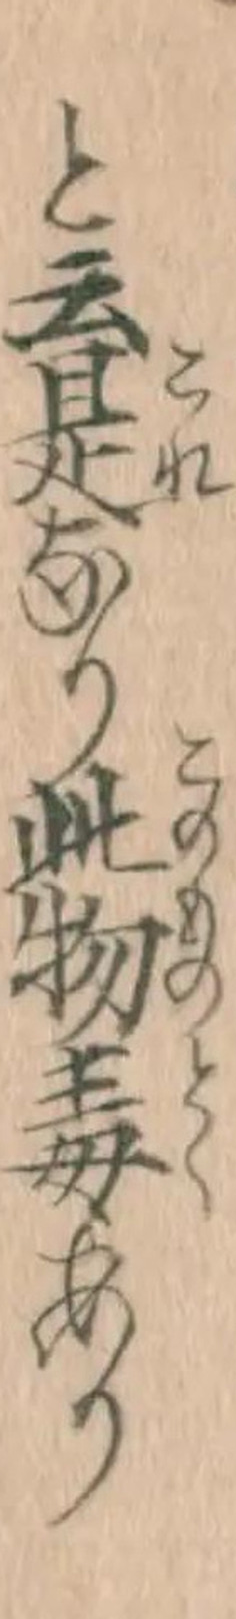と云是なり此物毒あり

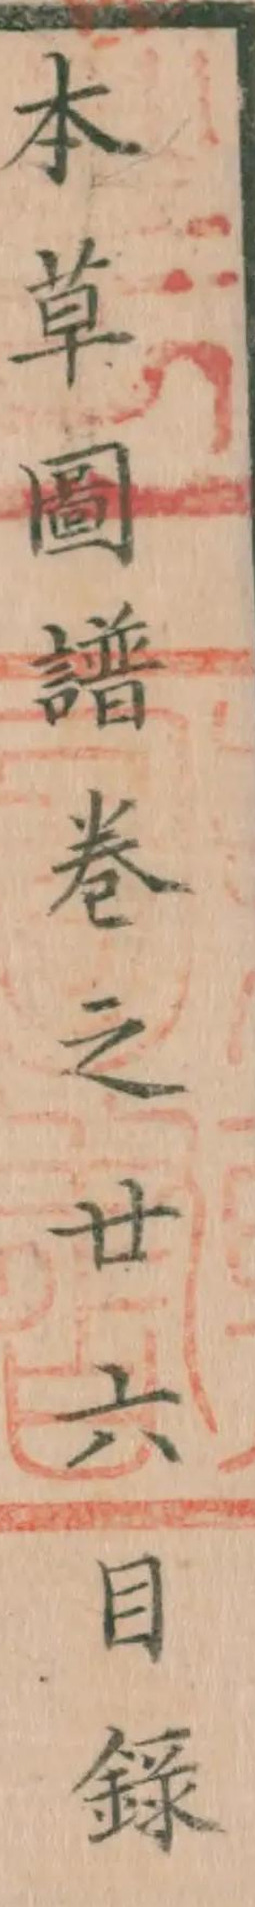本草図譜巻之廿六目録
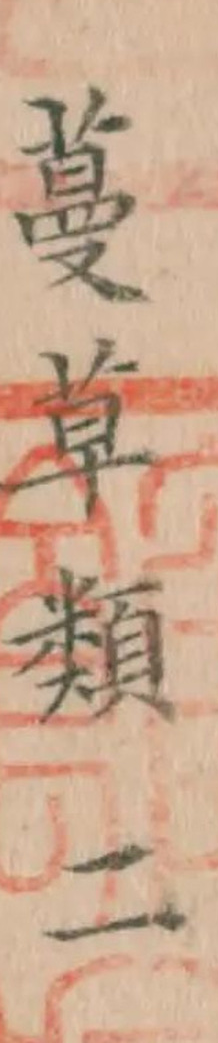蔓草類二

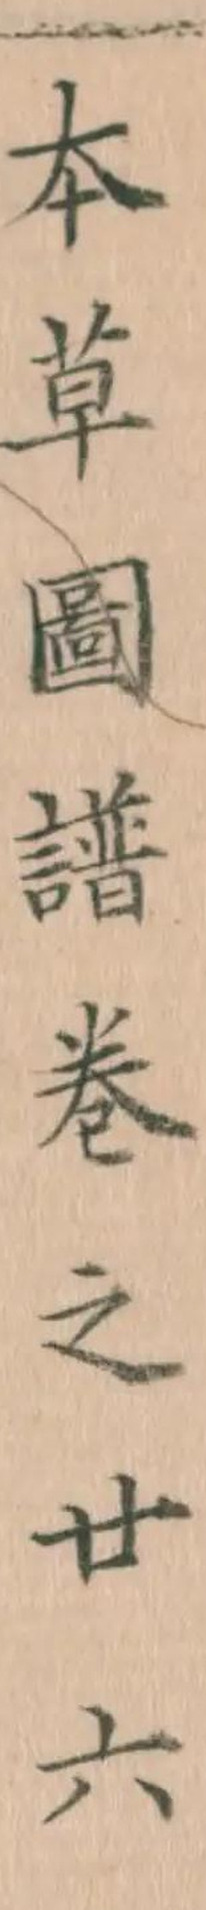本草図譜巻之廿六
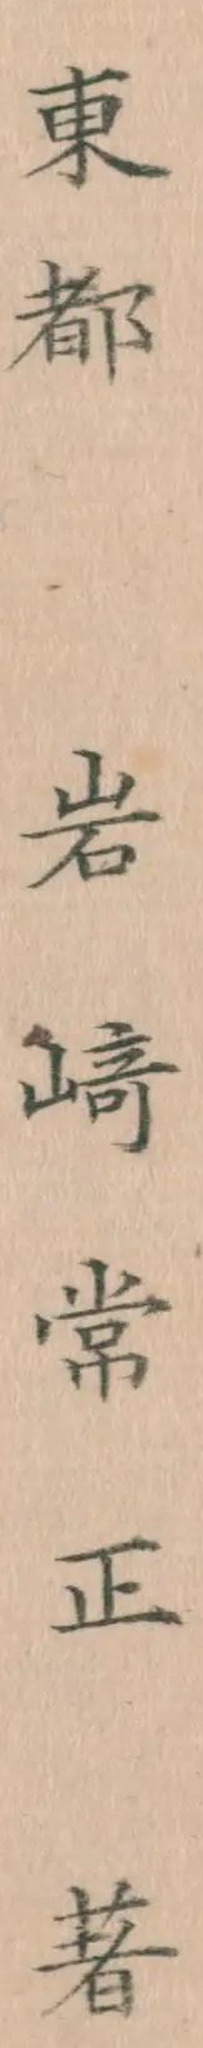東都岩崎常正著
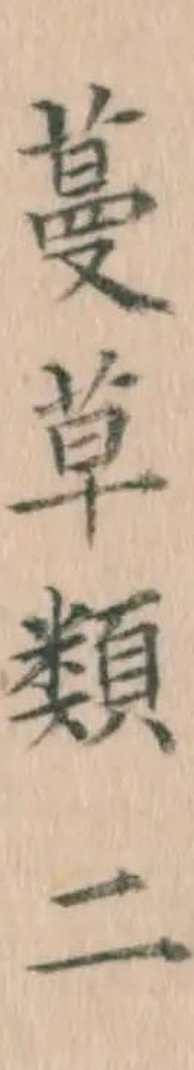蔓草類二

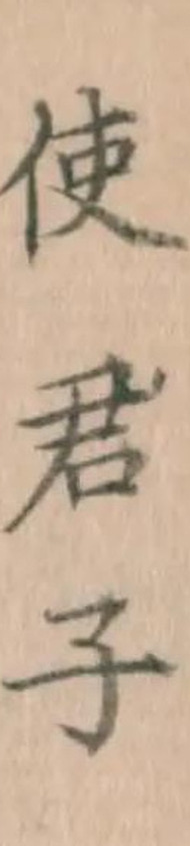使君子
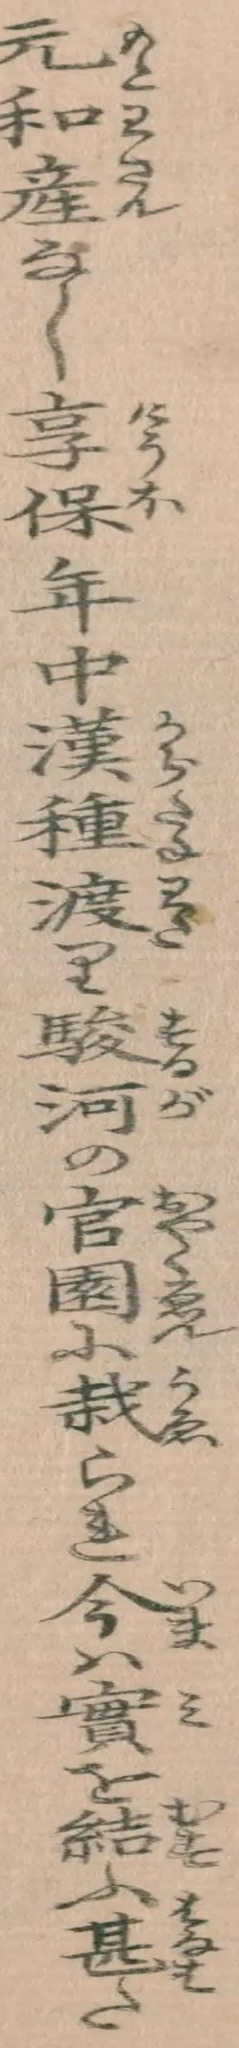元和産なし享保年中漢種渡り駿河の官園に栽られ今は実を結ふ甚た
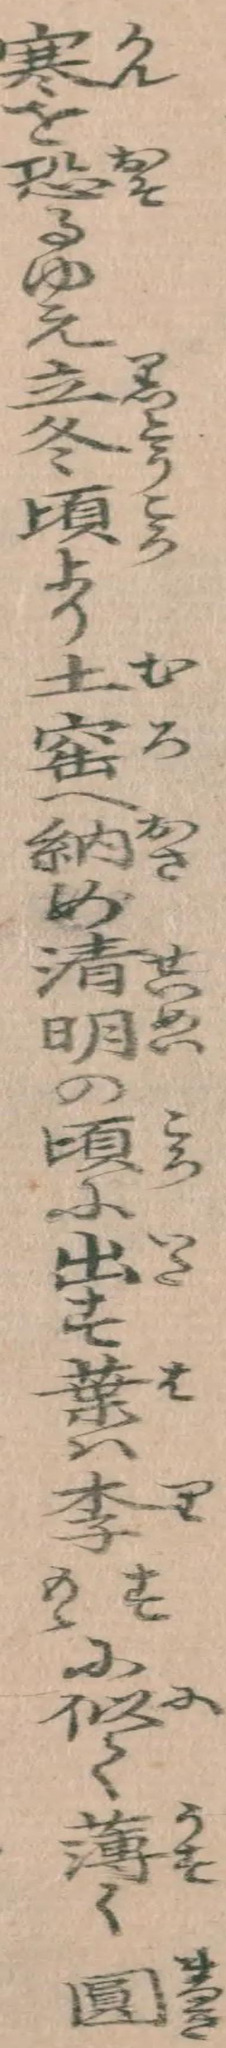寒を恐るゆえ立冬頃より土窯へ納め清明の頃に出す葉は李すもゝに似て薄く円
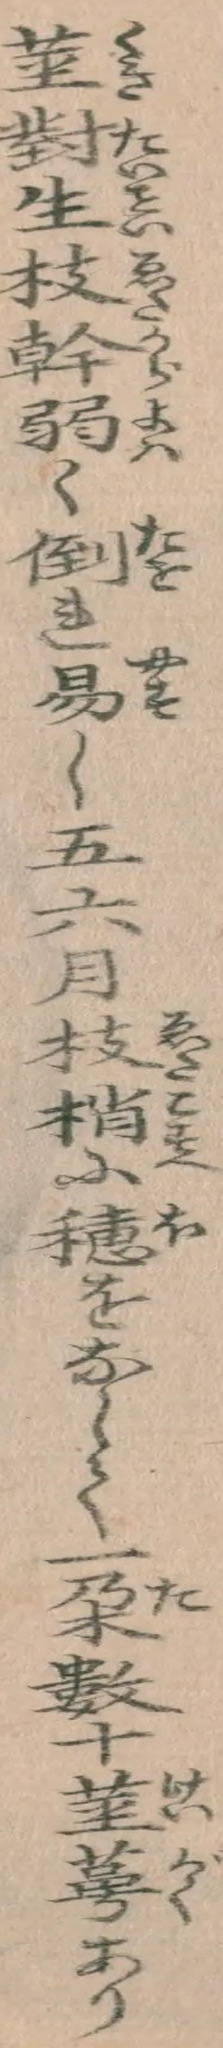茎対生枝幹弱く倒れ易し五六月枝梢に穂をなして一朶数十茎萼あり
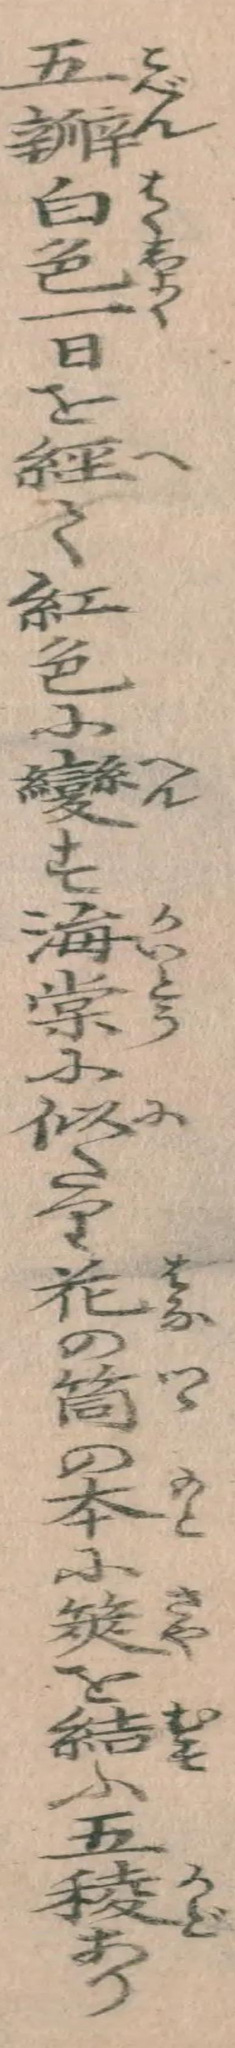五弁白色一日を経て紅色に変す海棠に似たり花の筒の本に莢を結ふ五稜あり
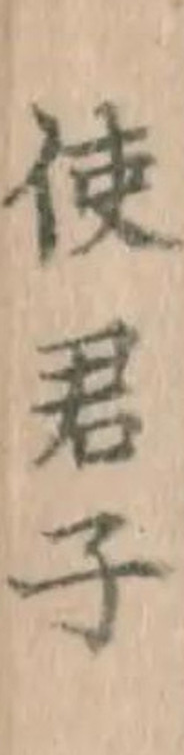使君子

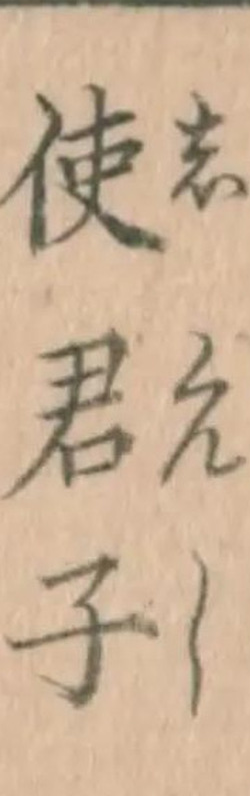使君子

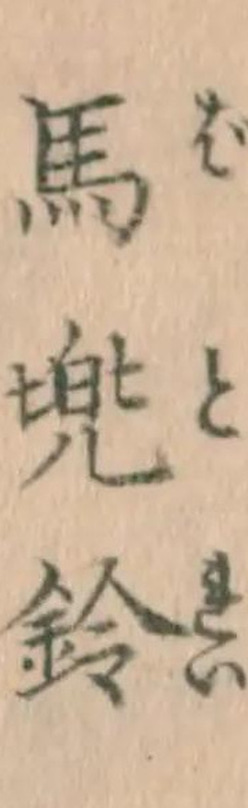馬兜鈴
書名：本草図譜. 巻25-27
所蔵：国立国会図書館 National Diet Library, JAPAN
